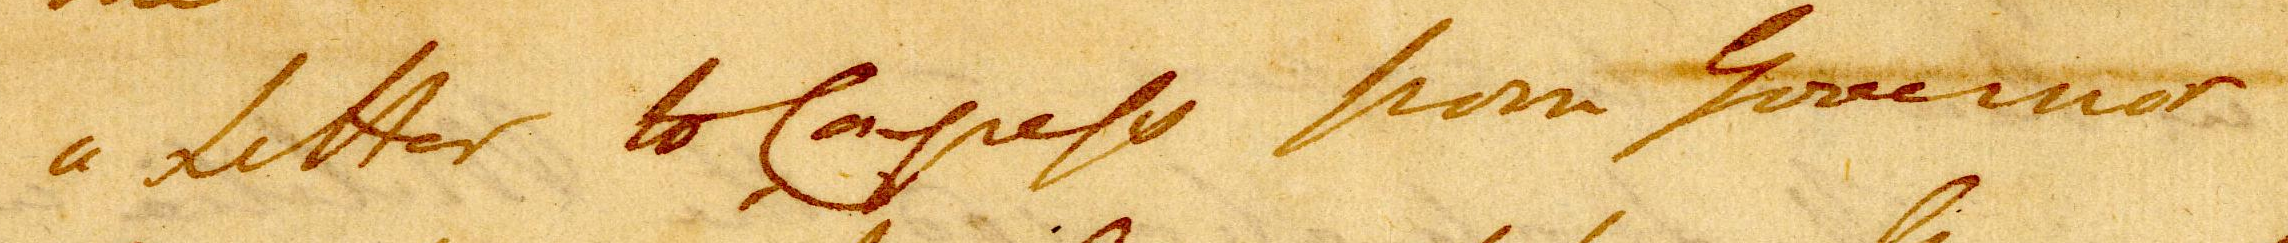a Letter to Congress from Governor
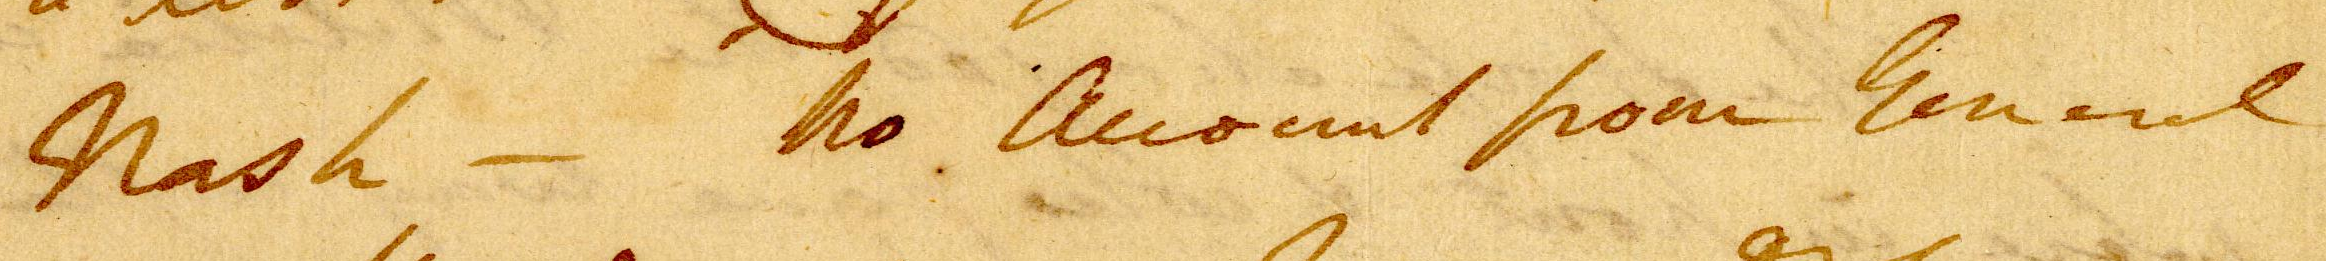Nash. No Account from General
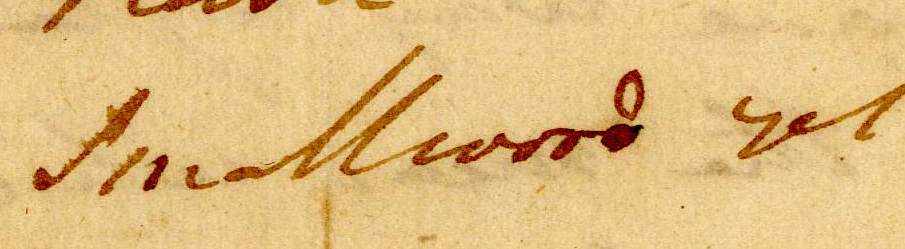Smallword yet
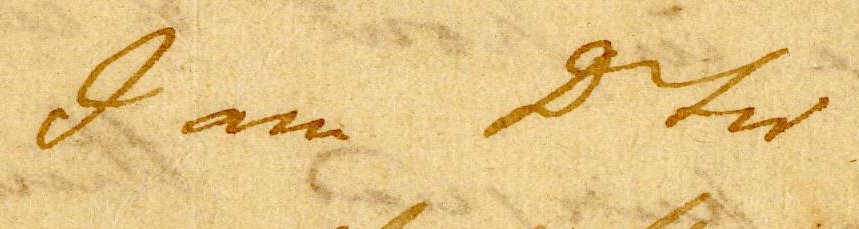I am D^r Sir
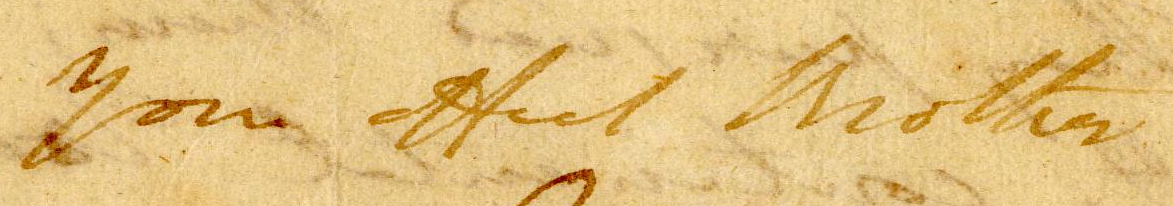Your affect Brother
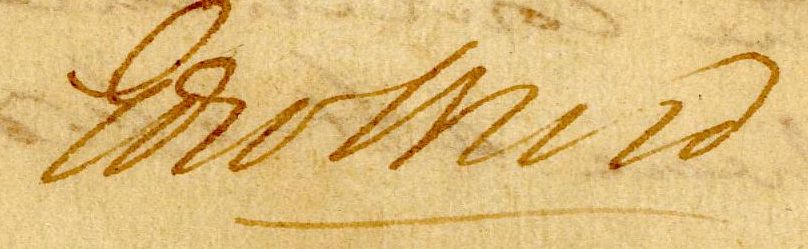Edw. Burd
